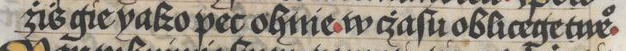żiṡ gie yako pec ohnie.w cżaſu oblicege tweo.
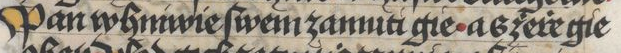Pan whniwie ſwem zamuti gie.a sżeṙe gie
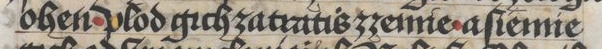ohen.Plod gich zatratiṡ zzemie.a ſiemie
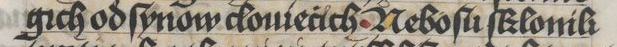gich od ſynow clovíeċich.Neboſu ſklonili
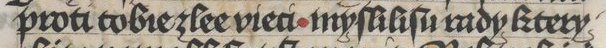proti tobie zlee vieci.myſliliſu rady ktery¬
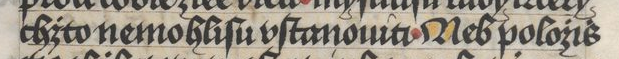chżto nemohli ſu vſtanoviti.Neb polożiṡ
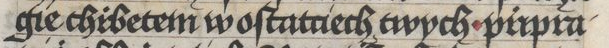gie chṙbetem w oſtatciech twych.pṙipra¬
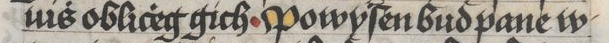víš obliċeg gích.Powyẛen bud pane w¬
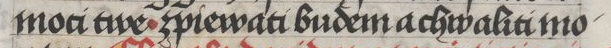moci twe.zpiewati budem a chwaliti mo¬
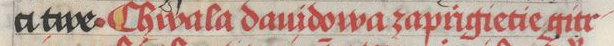ci twe.Chwala davidowa zapṙigietie gítr¬
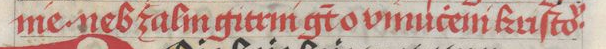nie.neb żalm gitrní ḡt o umuċení kriſtov.
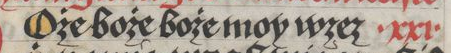Oże boże boże moy wzez. xxi.
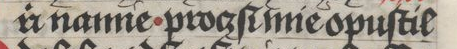ṙi namie.proczſi mie opuſtil
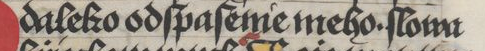daleko odſpaſenie meho.ſlowa
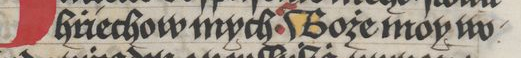hṙiechow mych.Boże moy wo¬
